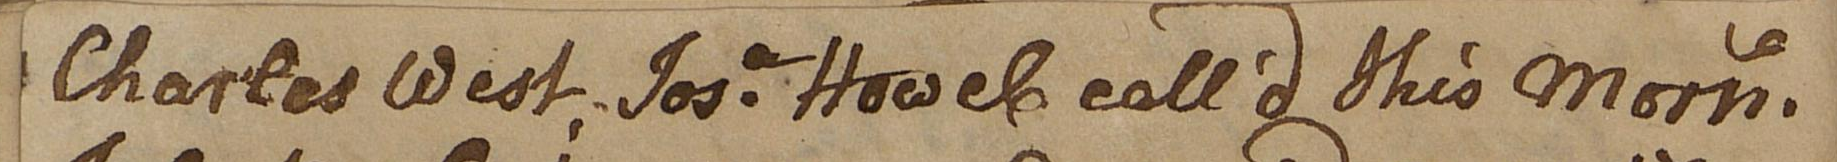Charles West Jos^a. Howel call'd this morn^g.
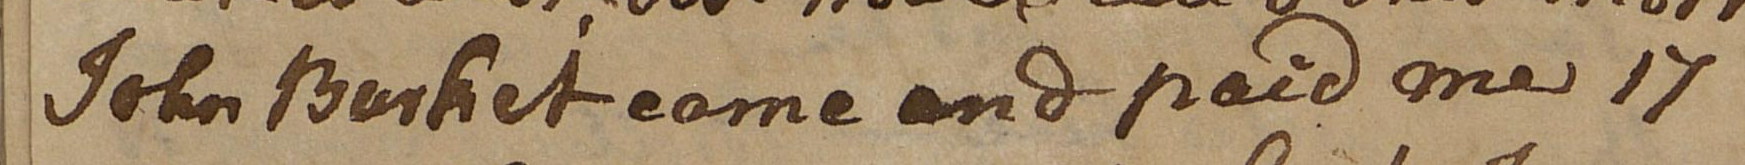John Burket came and paid me 17
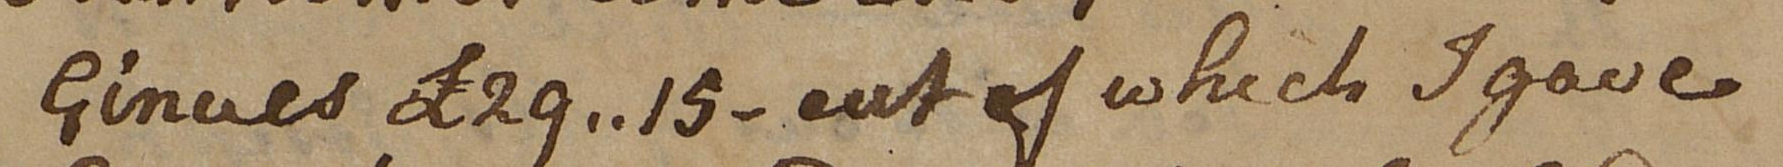Ginues £29..15- out of which I gave
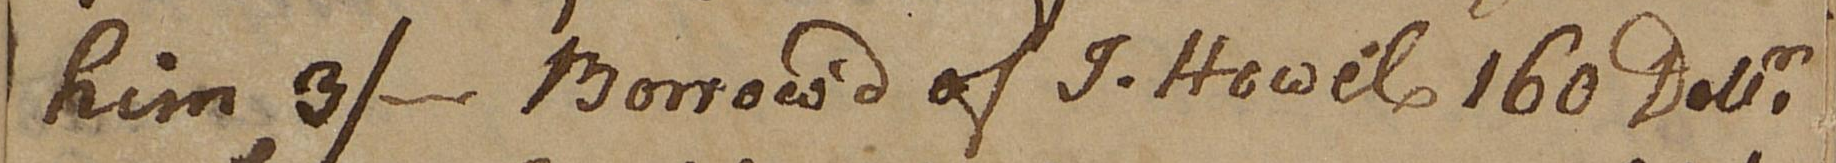him 3s- Borrow'd of J. Howel 160 Doll^r.
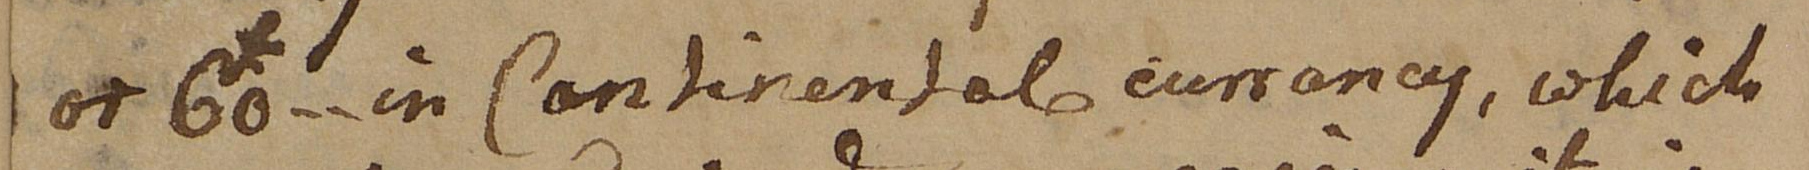or 60^£- in Continental currancy, which
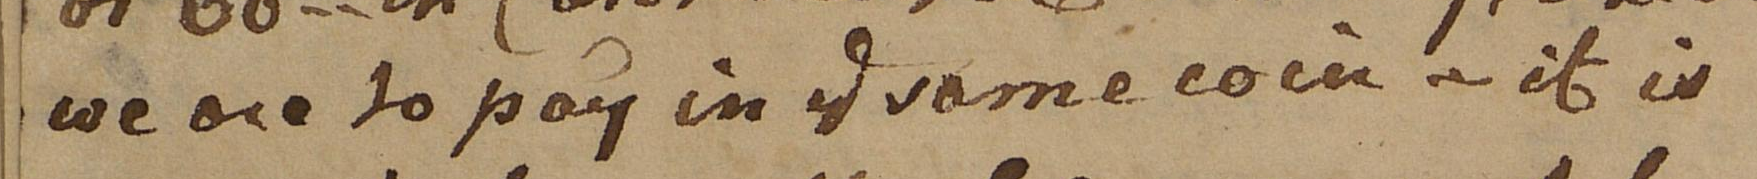we are to pay in y^e same coin- it is
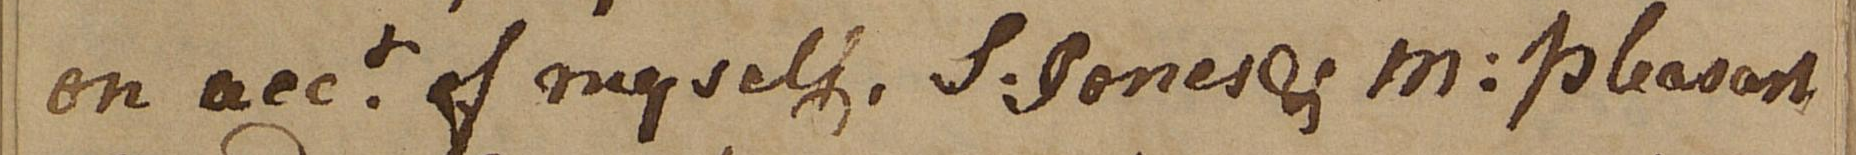on acc^t. of myself. S. Jones & M: Pleasant
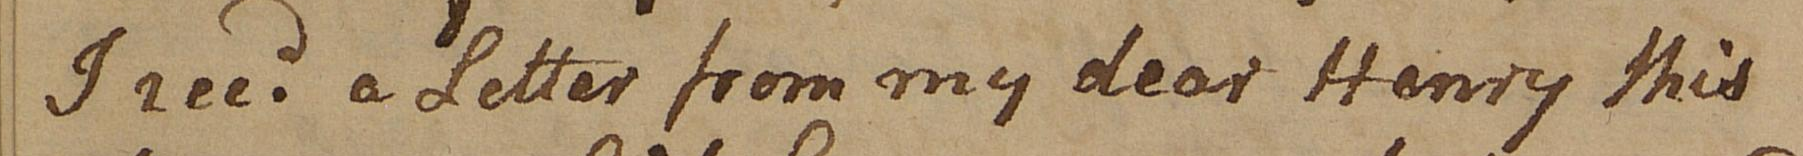I rec^d. a Letter from my dear Henry this
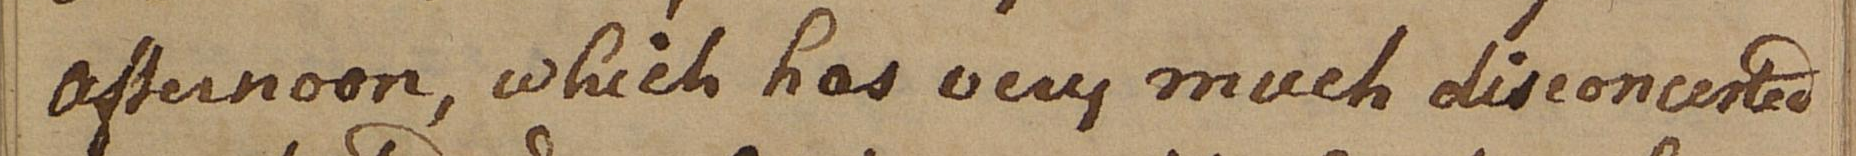afternoon, which has very much disconcerted
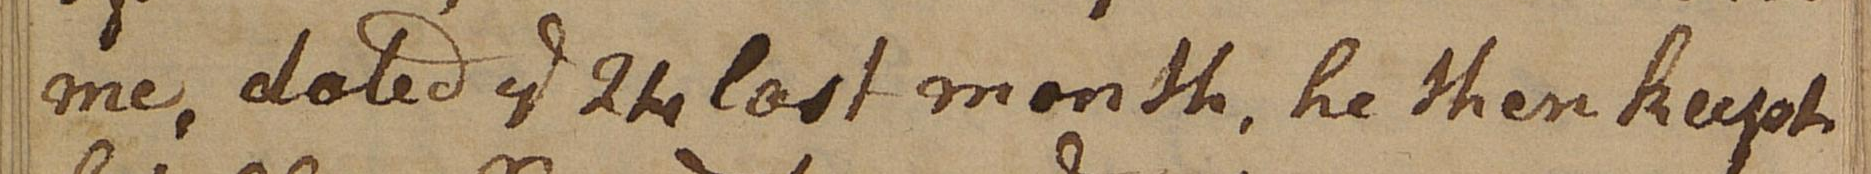me, dated y^e 24 last month, he then keept
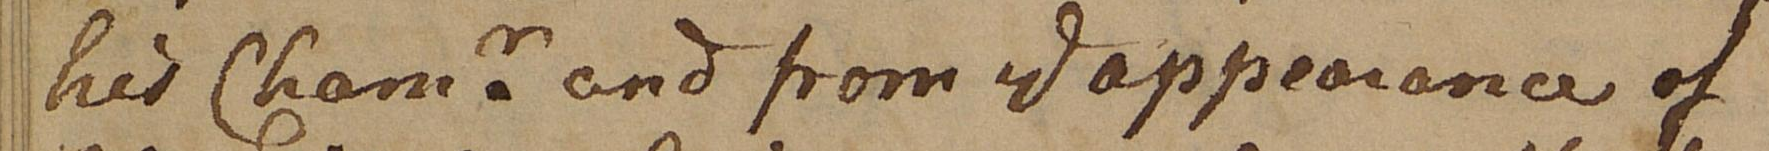he's Cham^r. and from y^e appearance of
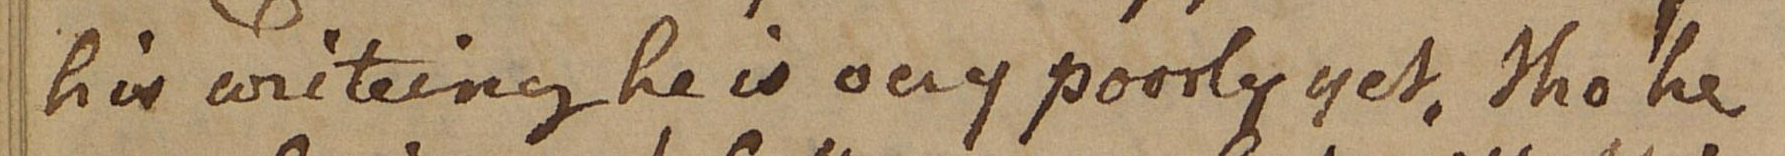his writeing he is very poorly yet, tho he
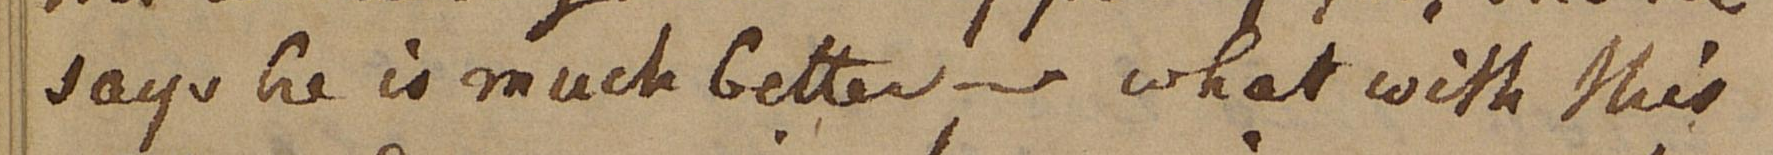says he is much better- what with this
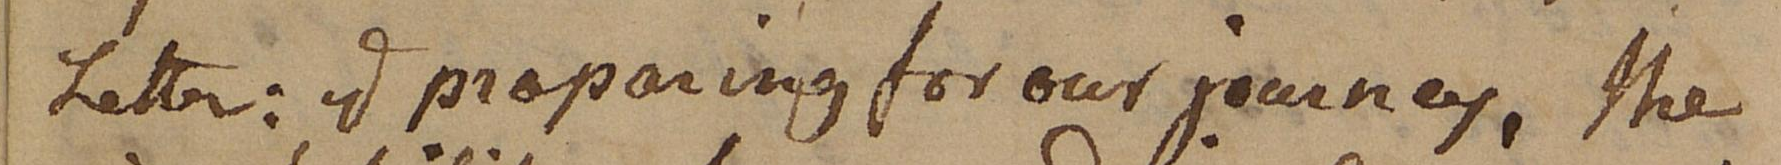Letter: y^e preparing for our journey, the
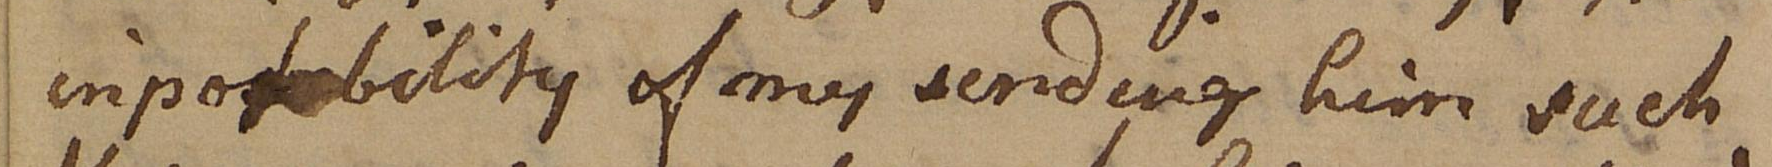inpo[ssi]bility of my sending him such
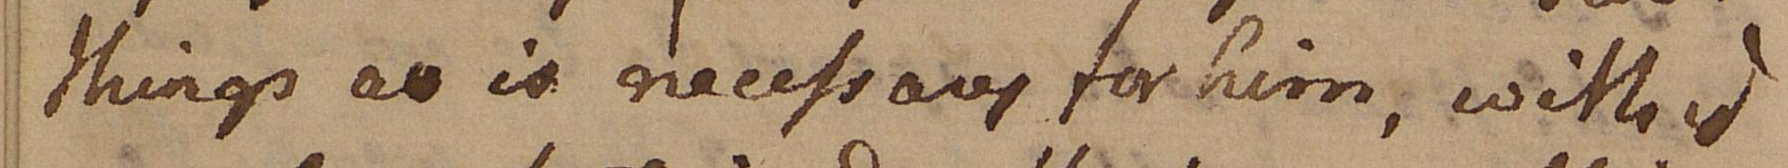things as is necessary for him, will y^e
